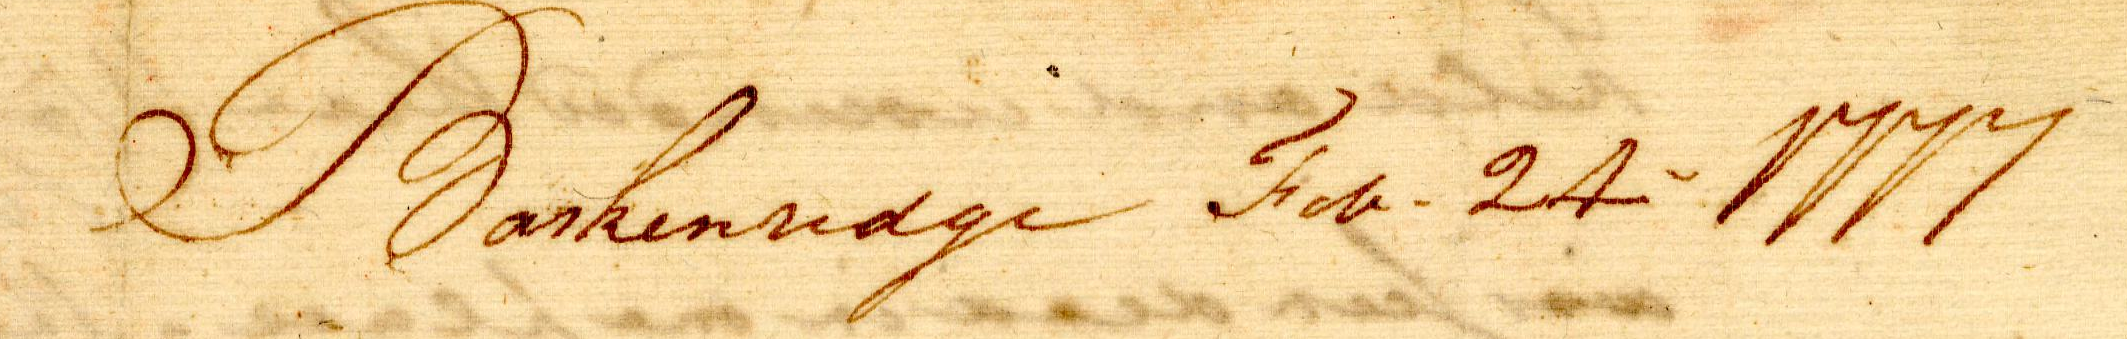Baskenridge Feb. 24. 1777
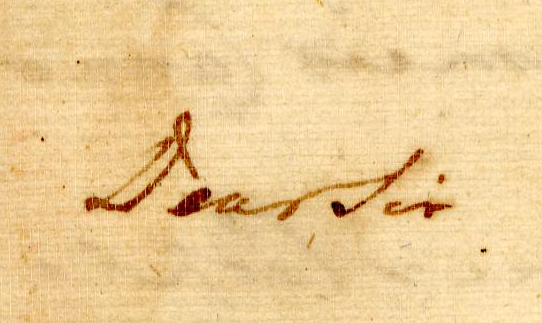Dear Sir
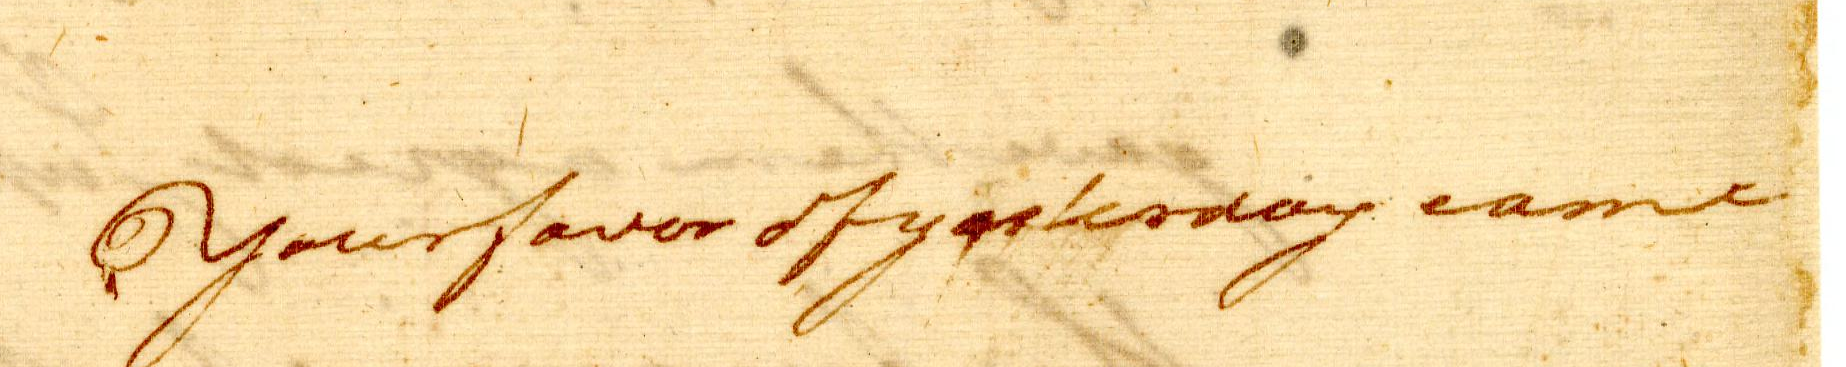Your favor of yesterday came
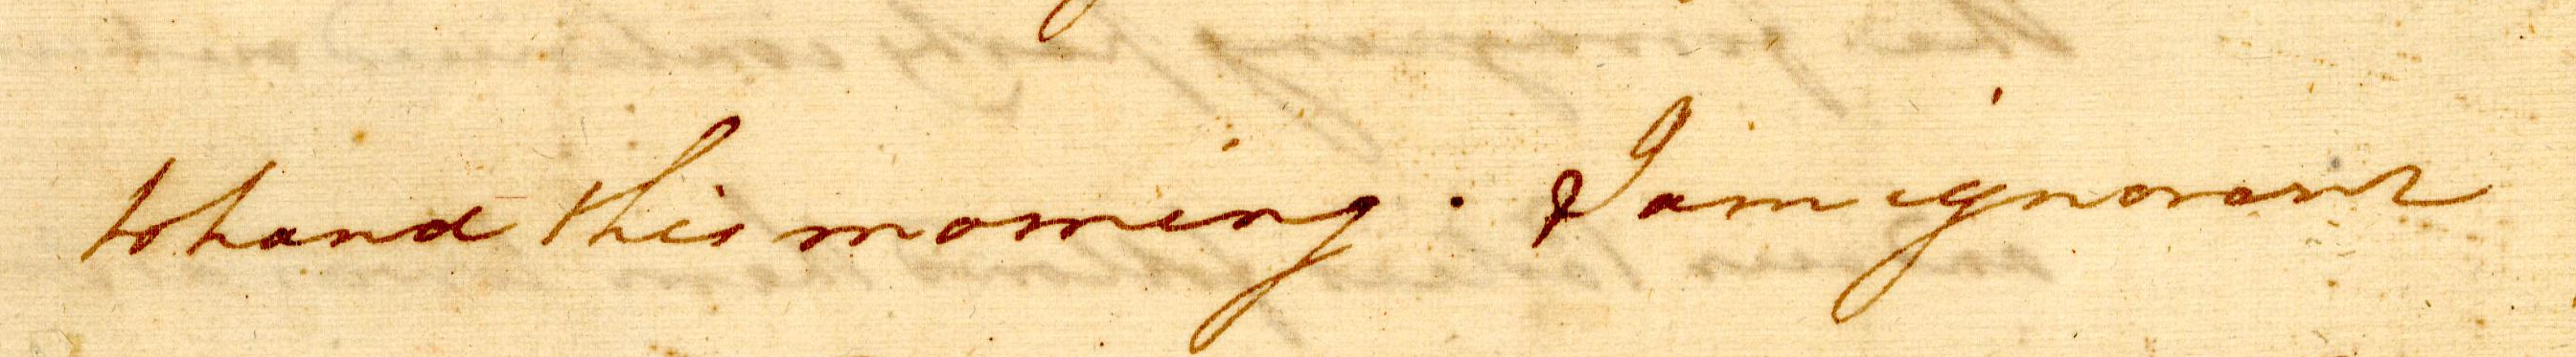to hand this morning. I am ignorant
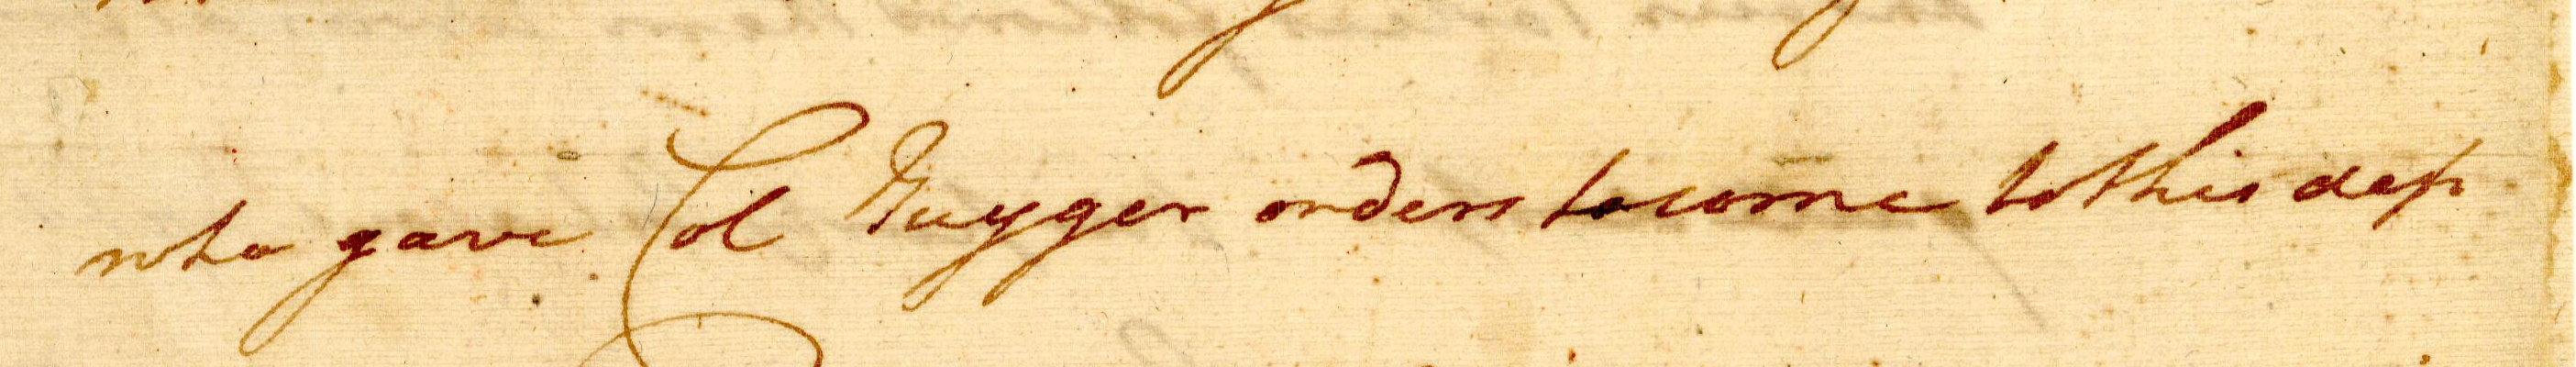who gave Col Ruyger orders to come to this dep
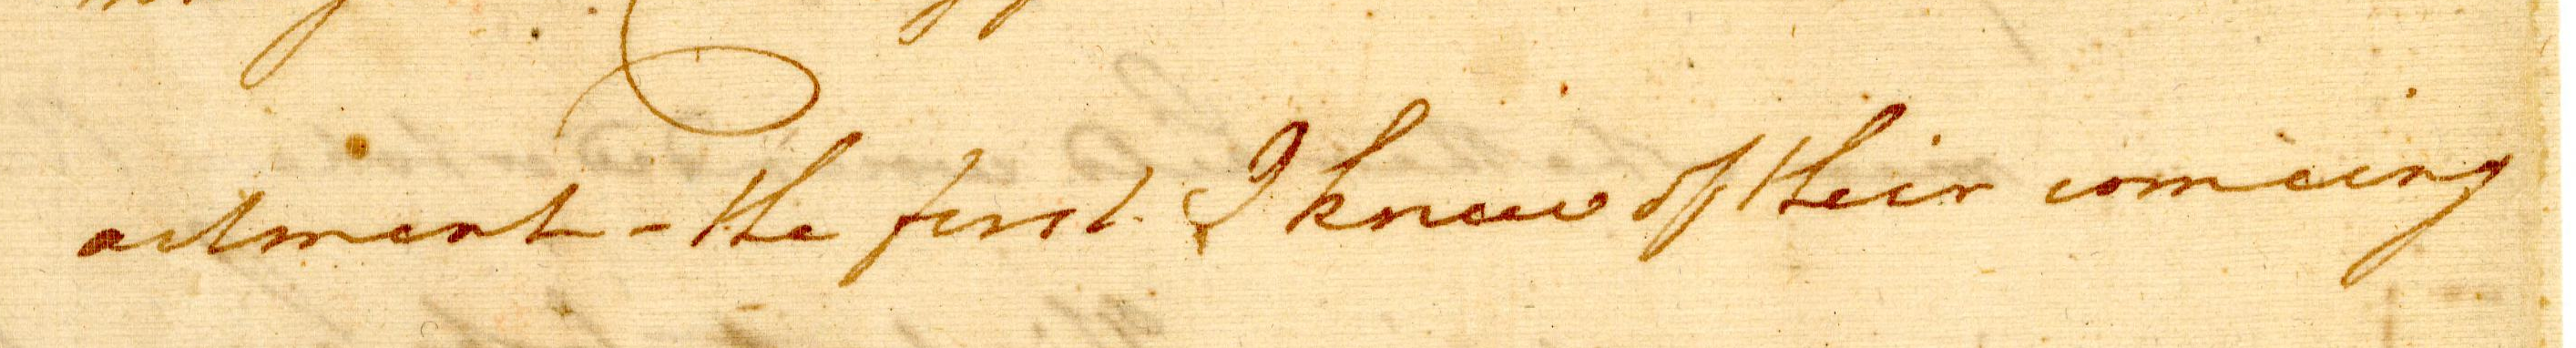artment- the first I knew of their coming
